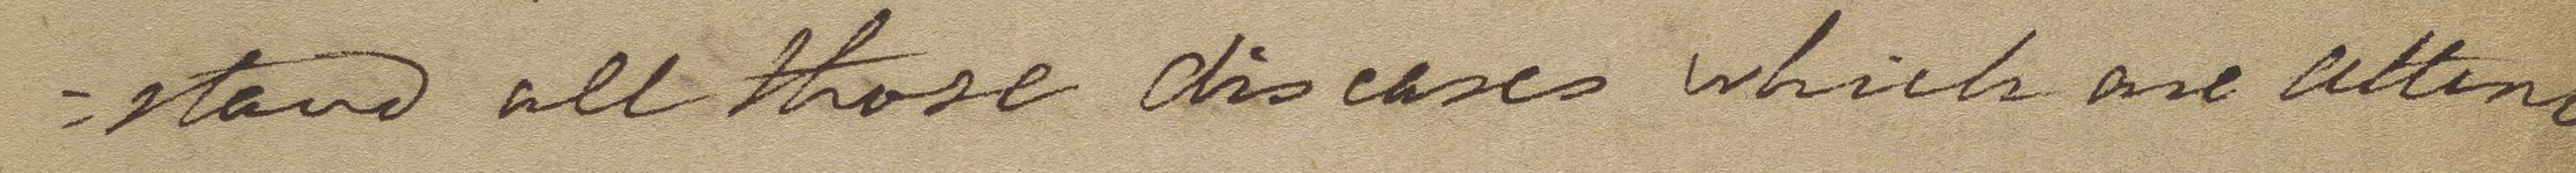-stand all those diseases which are atten-
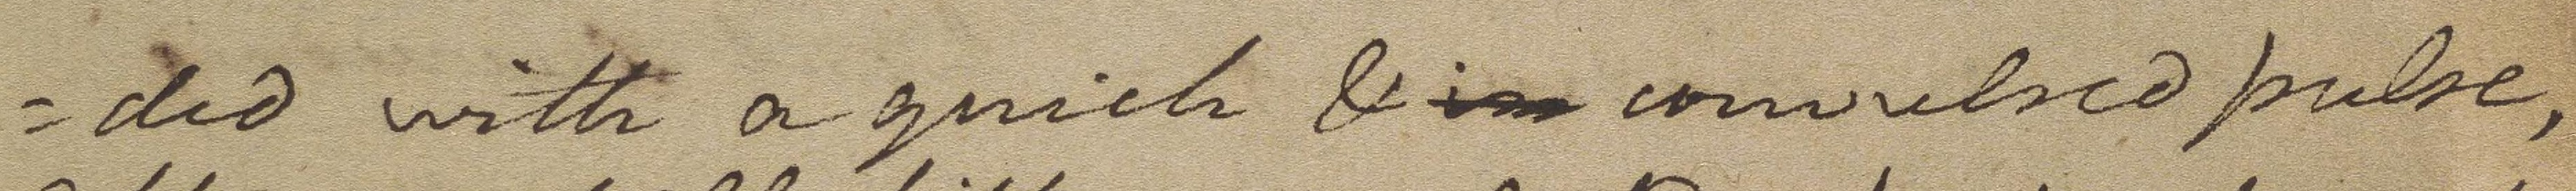-ded with a quick & [in] convulsed pulse,
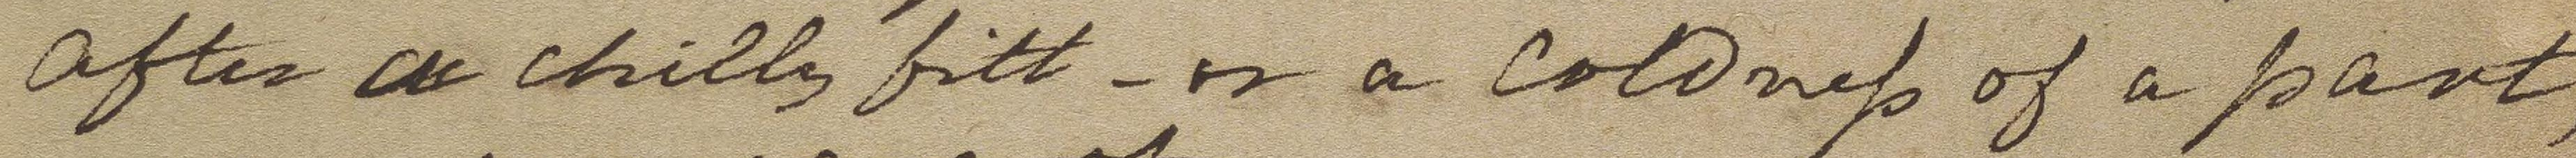after a chilly fitt- or a coldness of a part
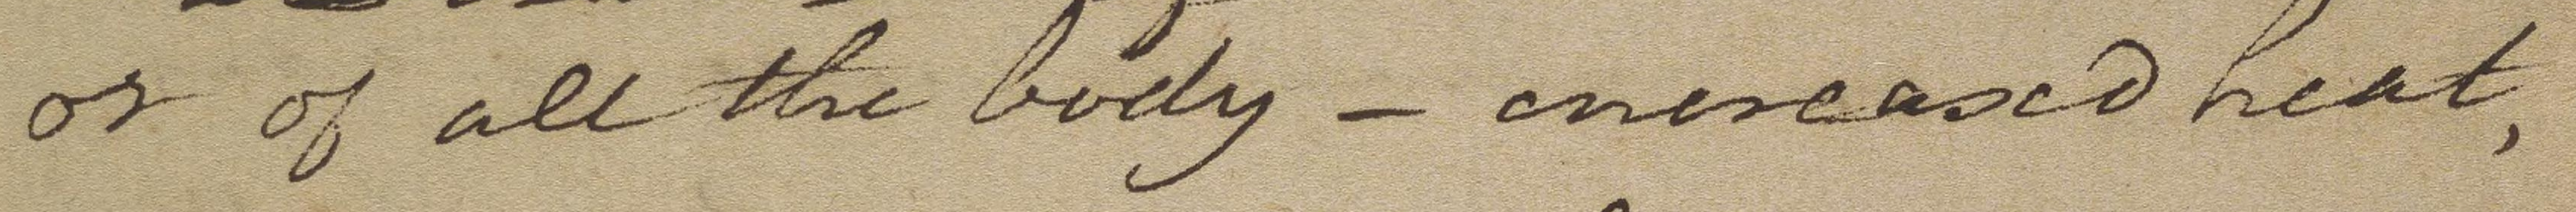or of all the body- increased heat,
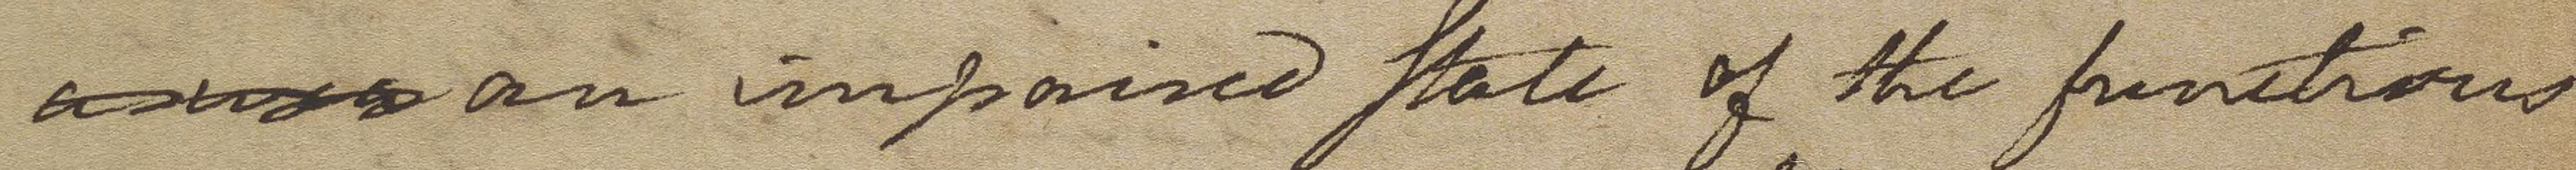[_____] an impaired state of the frenetrious
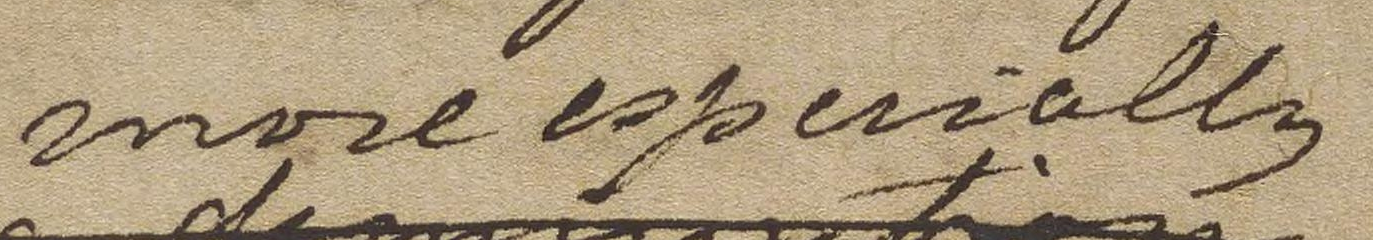more especially
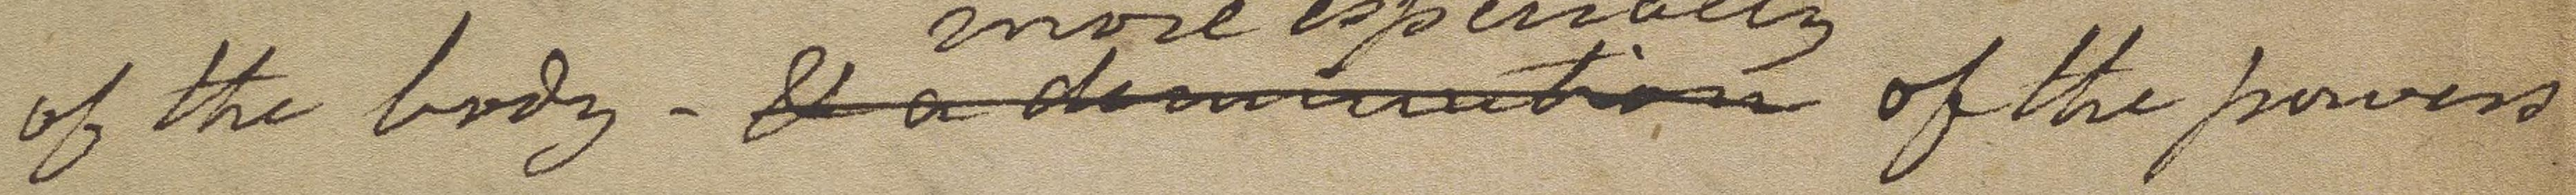of the body- [& a determination] of the powers
